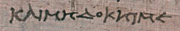καιμηδοκηιμε
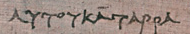αυτουκαταρρα
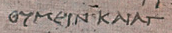θυμεινκαιαγ
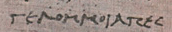γελομμοιαπεϲ
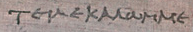τειλεκαλωμμε
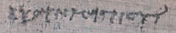ϲυουνμοιτιϲυν
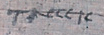ταϲϲειϲ
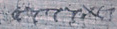ευτυχει
